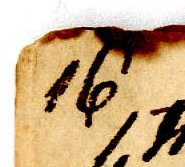16
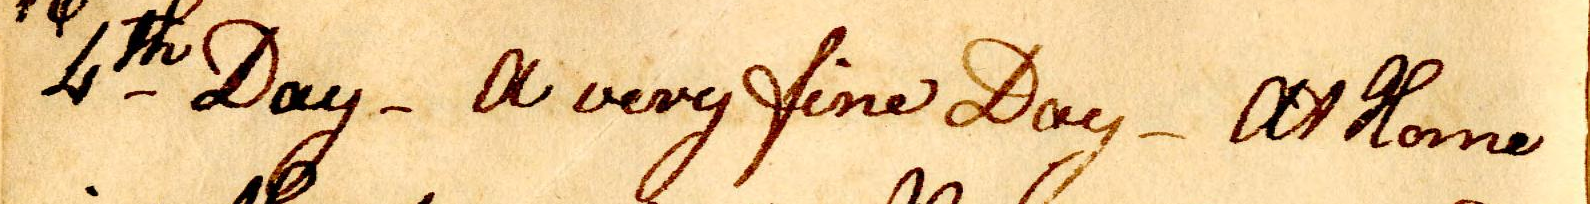4^th Day- A very fine Day- At Home
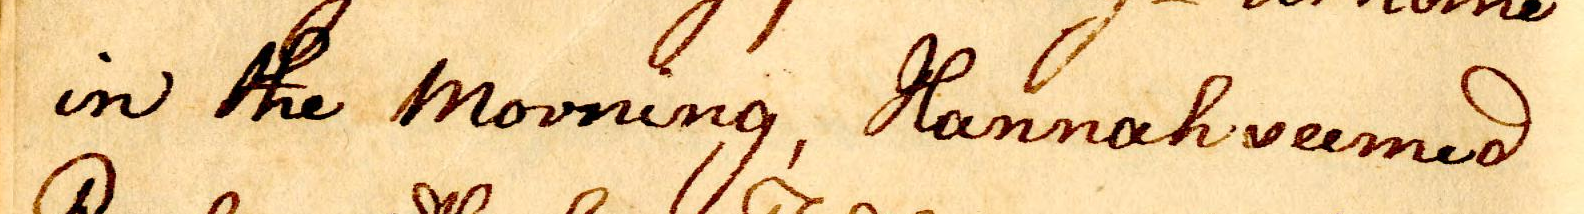in the Morning, Hannah seemed
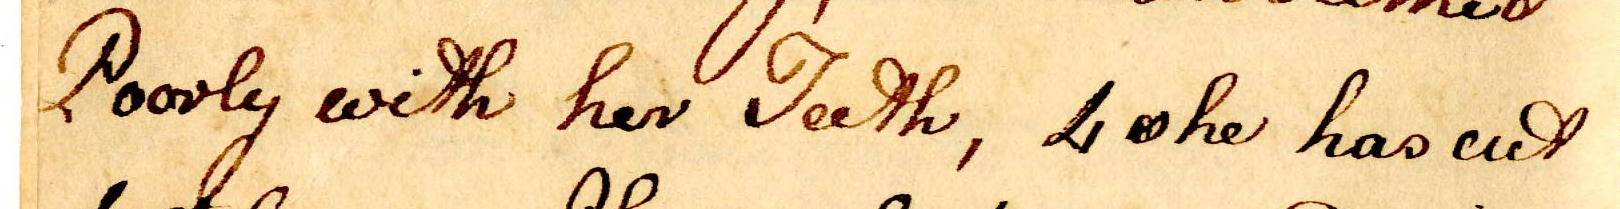Poorly with her Teeth, 4 she has cut
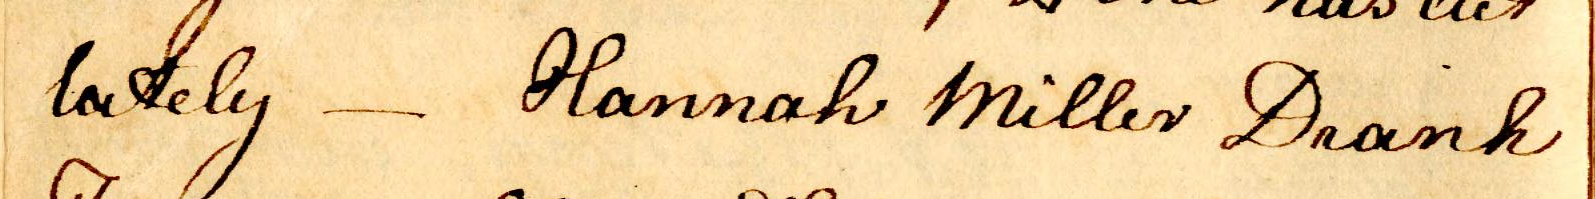lately- Hannah Miller Drank
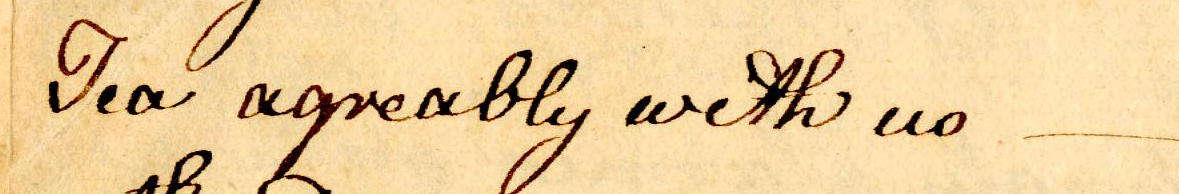Tea agreably with us-
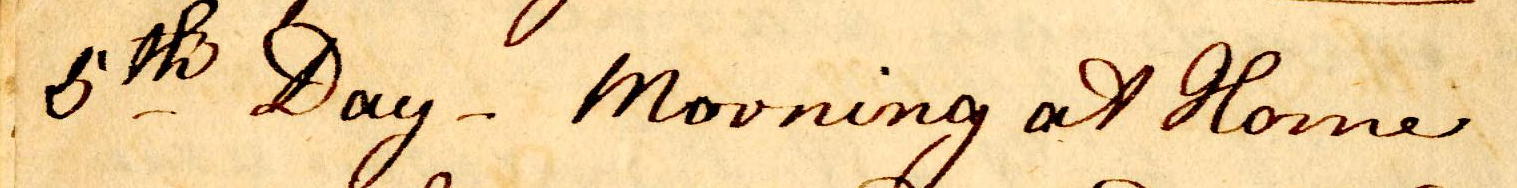5^th Day- Morning at Home
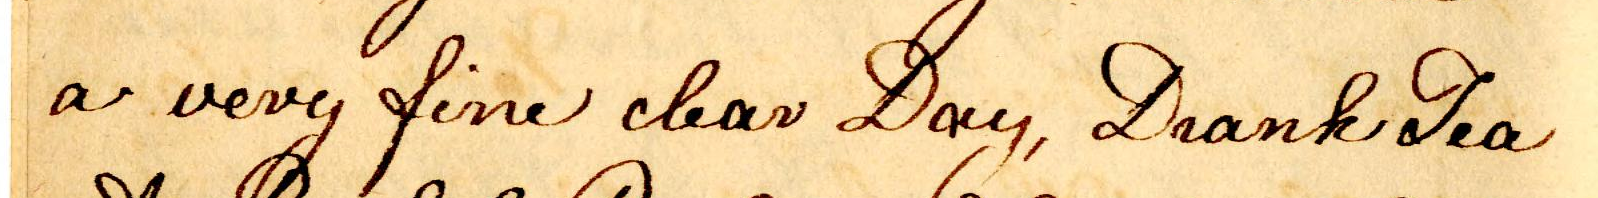a very fine clear Day, Drank Tea
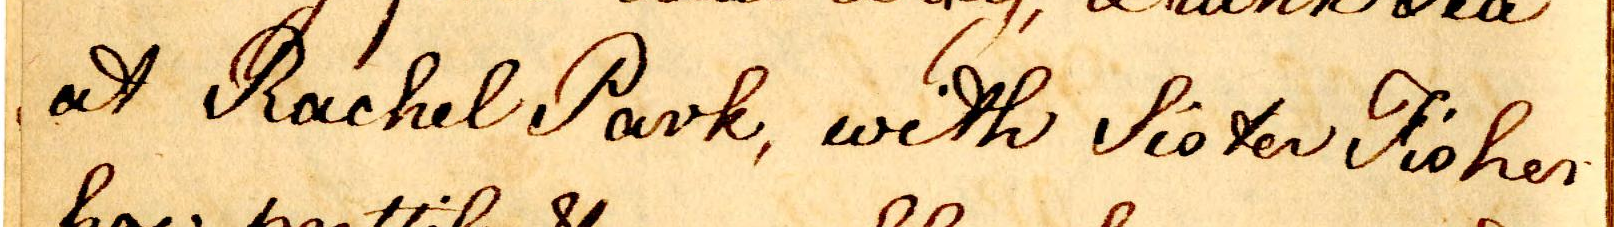at Rachel Park, with Sister Fisher
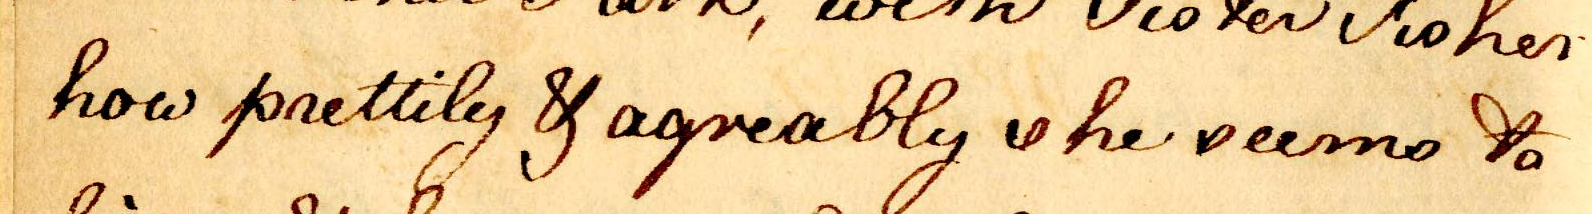how prettily & agreably she seems to
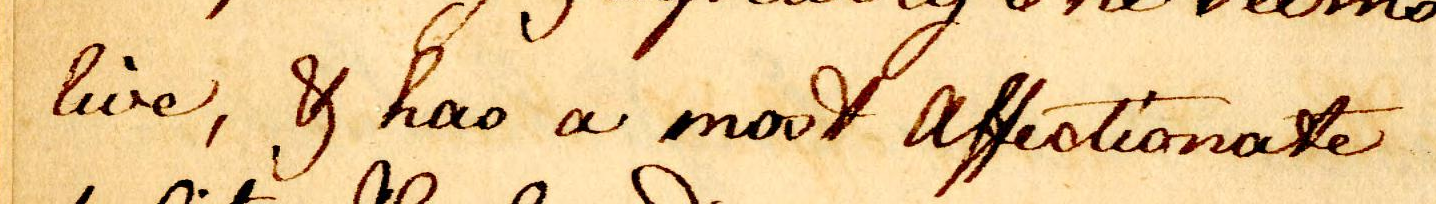live, & had a most Affectionate
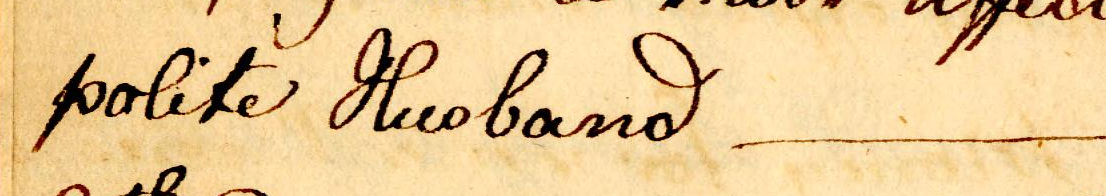polite Husband
